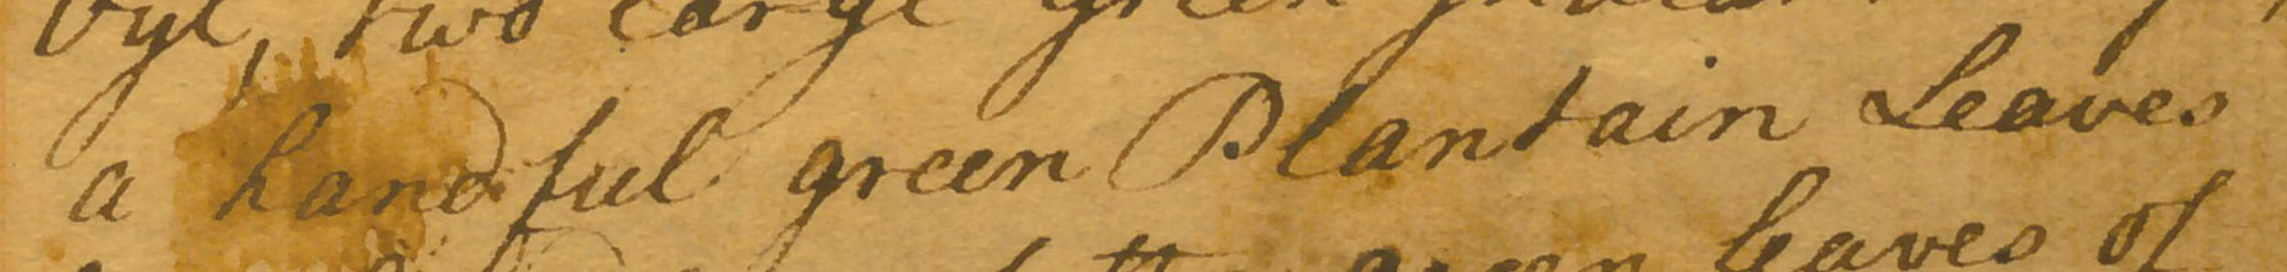a handful green Plantain Leaves
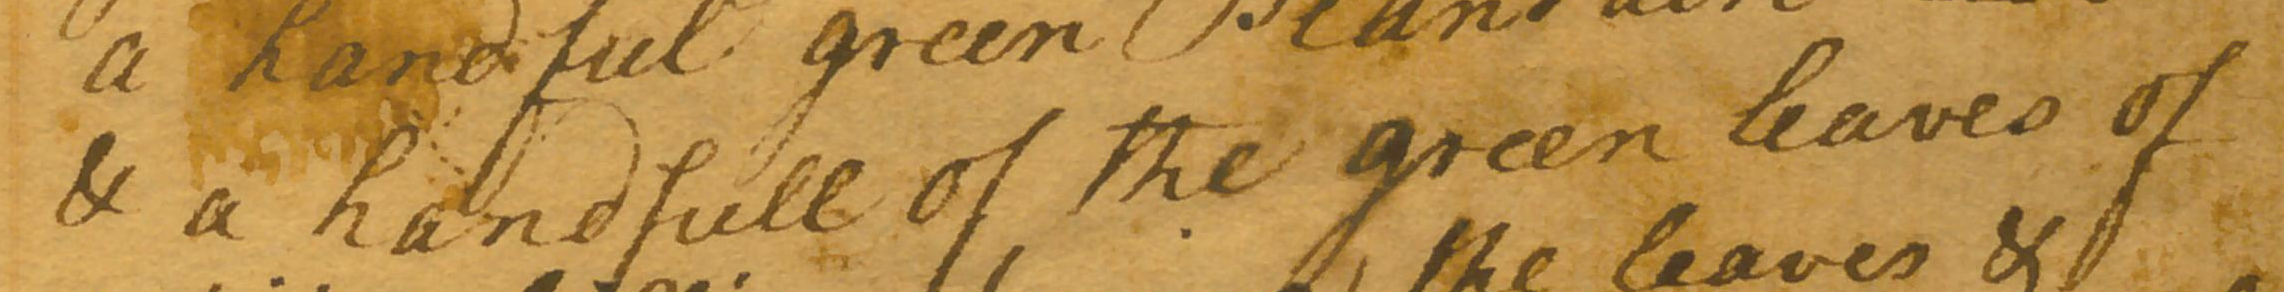& a handfull of the green leaves of
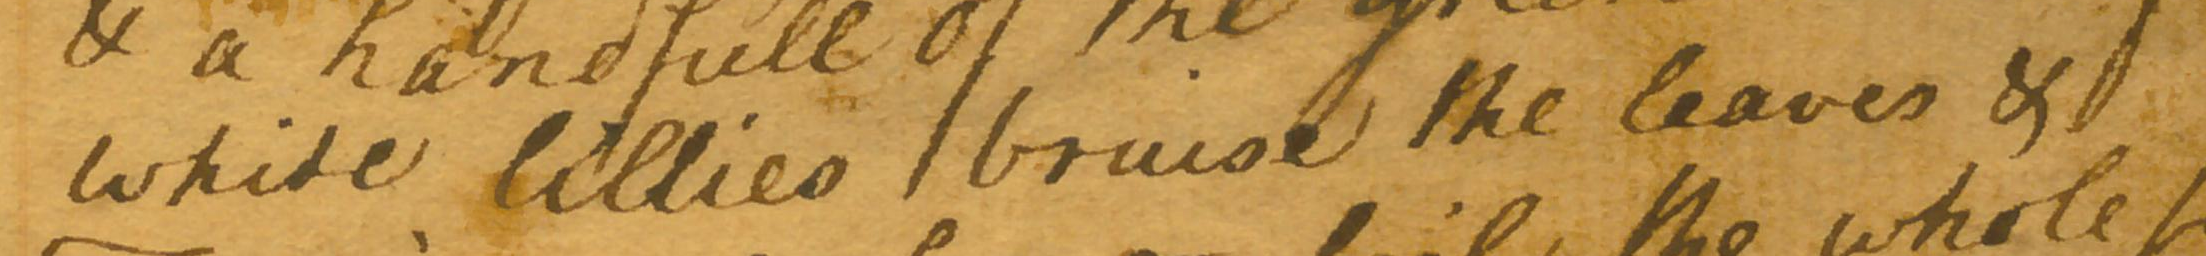white lillies bruise the leaves &
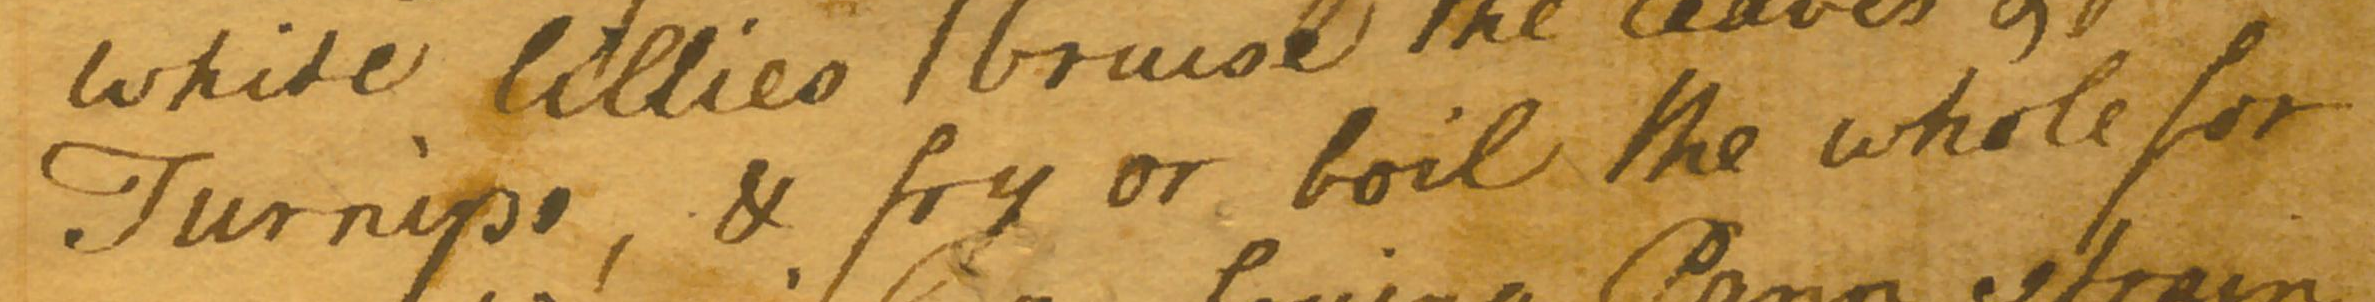Turnips, & fry or boil the whole for
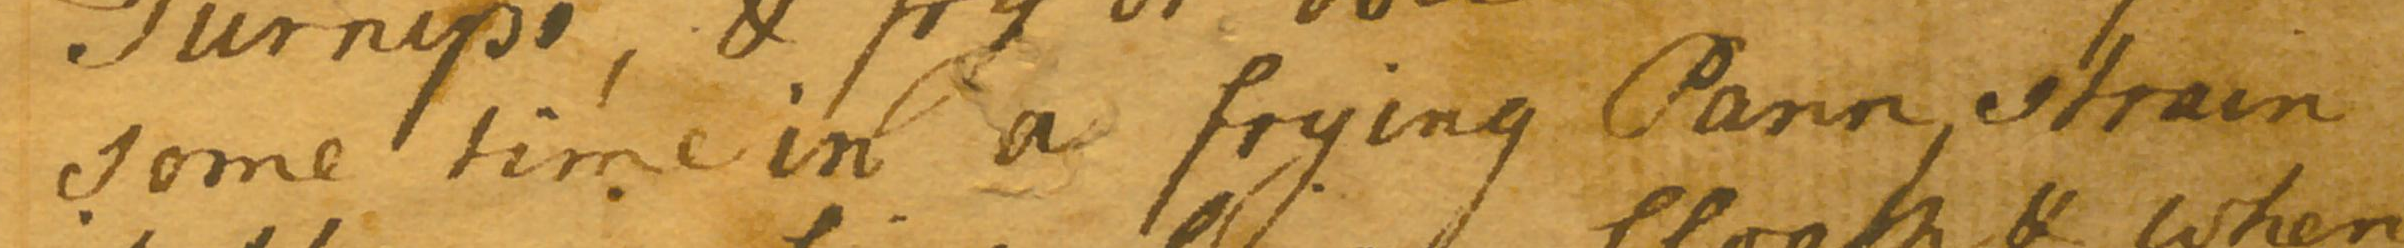some time in a frying Pann, strain
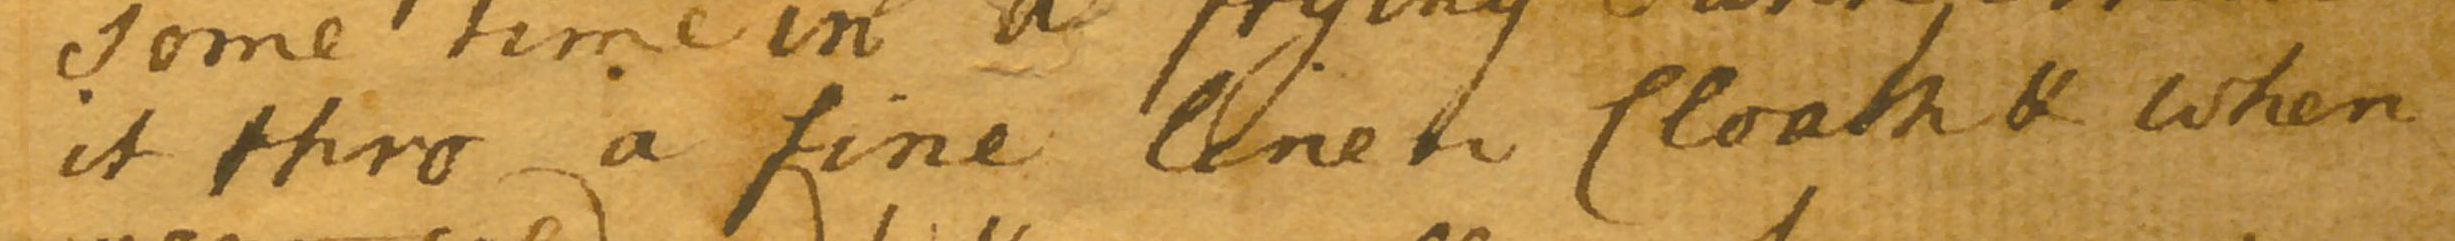it thro a fine linen Cloath & when
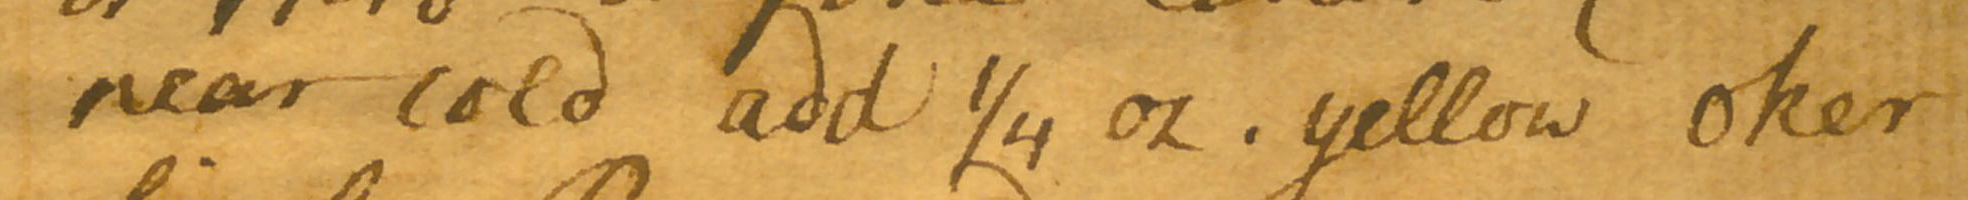near cold add 1/4 oz. yellow oker
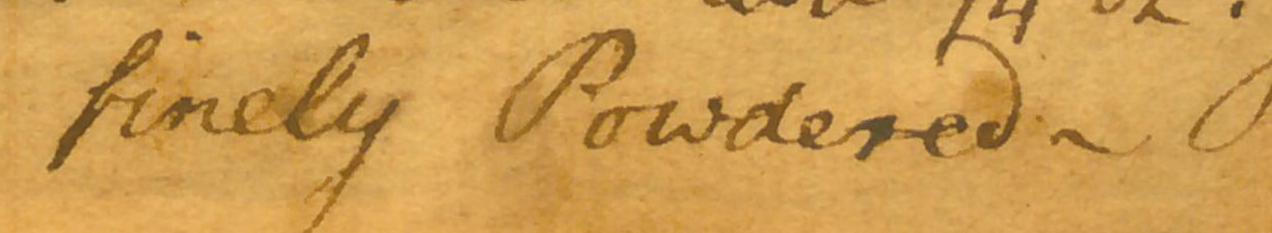finely Powdered-
